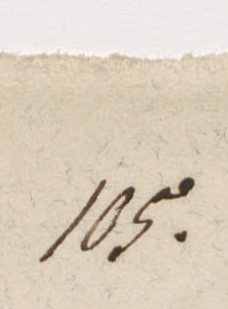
105.
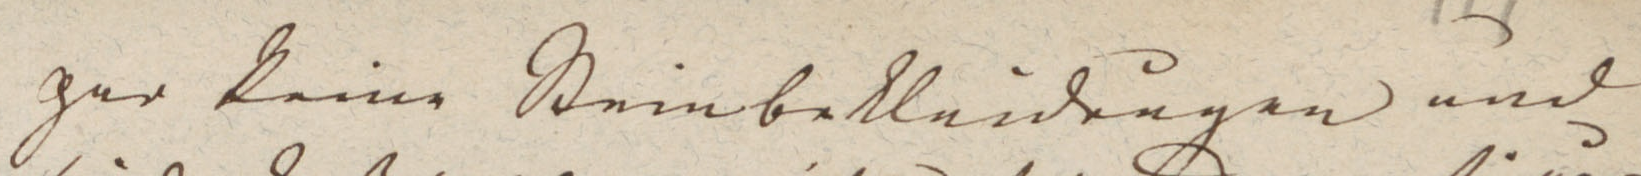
gar keine Steinbekleidungen und
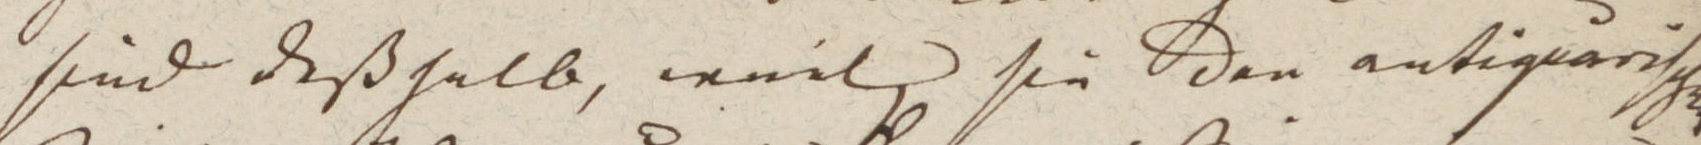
sind desshalb, weil sie den antiquarischen
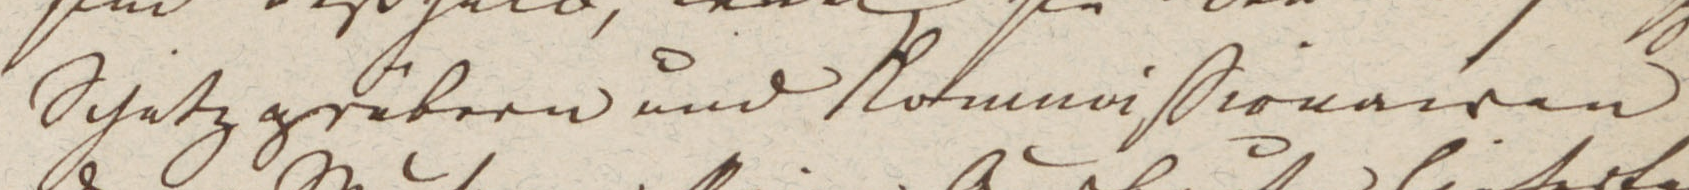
Schatzgräbern und CKommissionairen
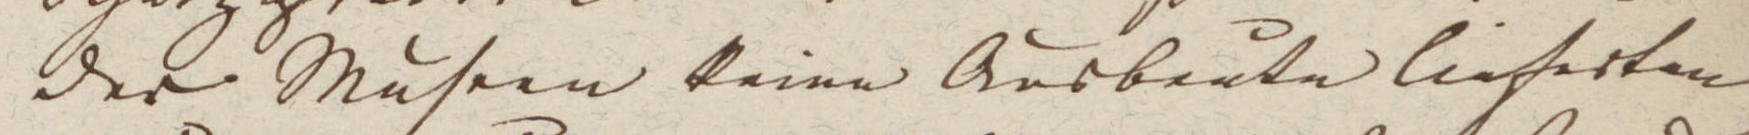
der Museen keine Ausbeute lieferten
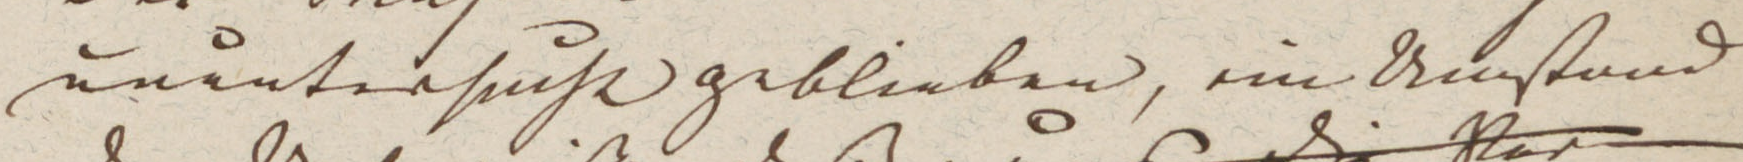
ununtersucht geblieben, ein Umstand
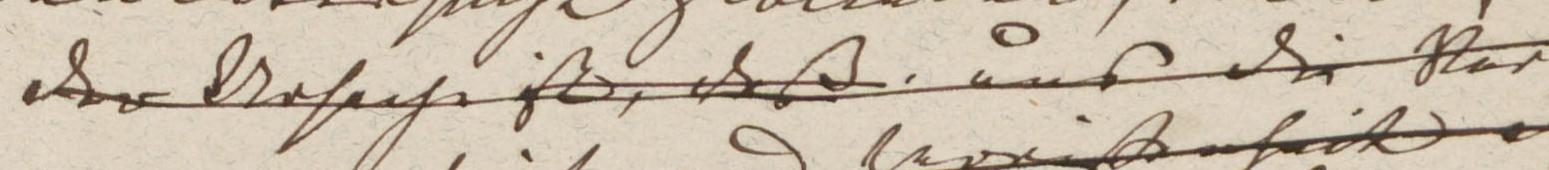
der Ursache ist, dass uns die Ver-
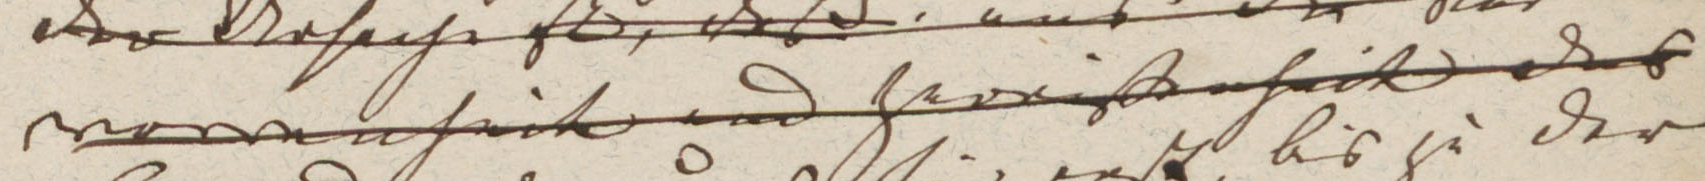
worrenheit und Gewissenheit des
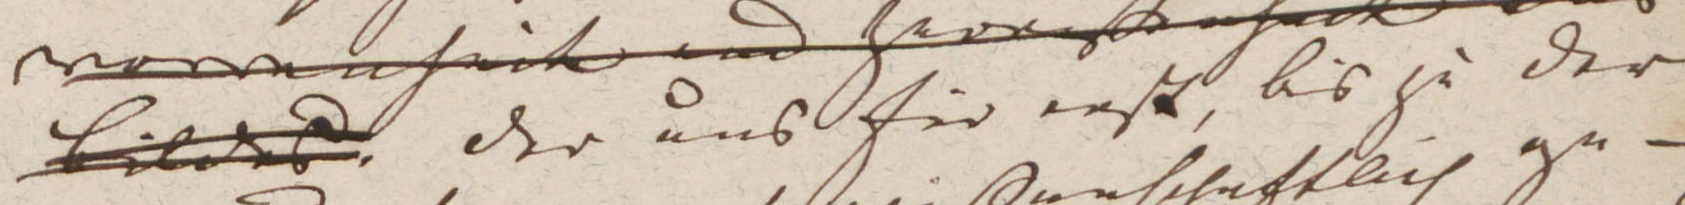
Bildes der uns für erst, bis zu der
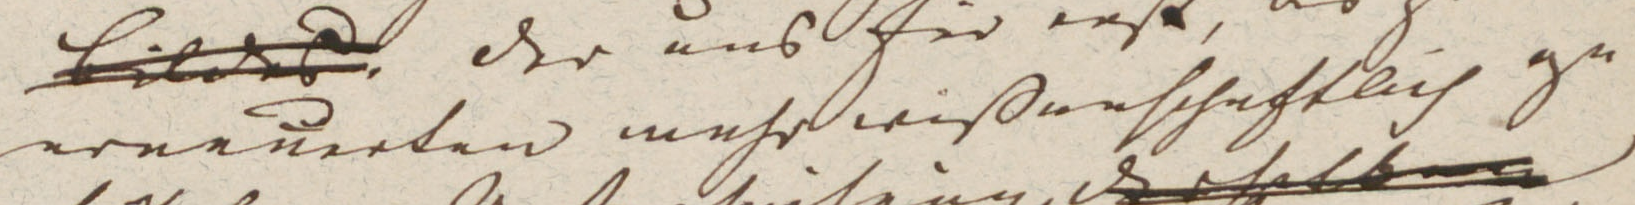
erneuerten mehr wissenschaftlich ge-
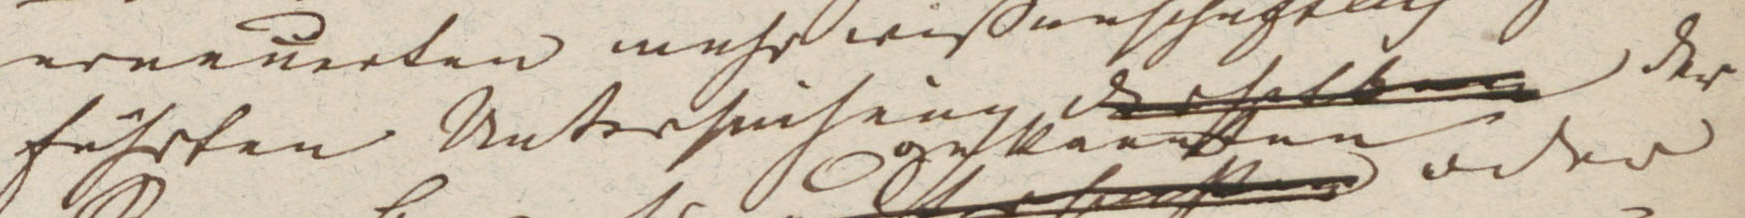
führten Untersuchung derselben der
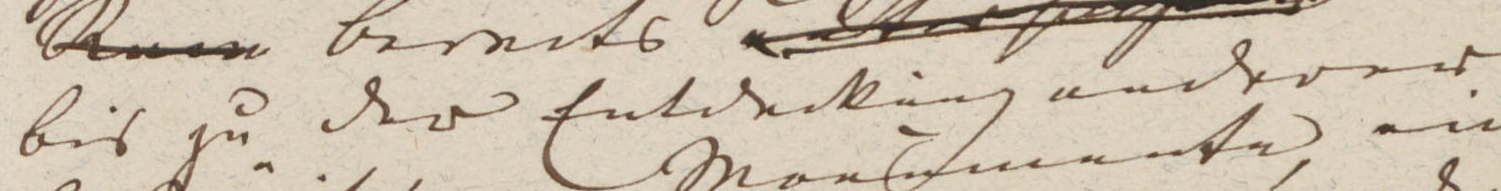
bis zu der Entdeckung anderer
